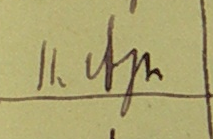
11. April
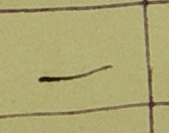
-
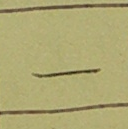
-
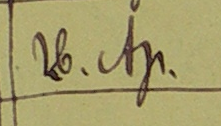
26. April
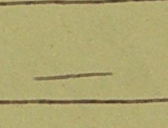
-
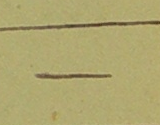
-
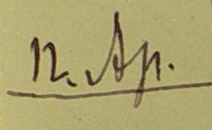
12. April
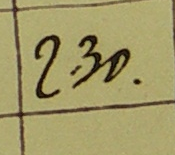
2.30
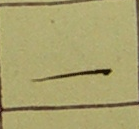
-
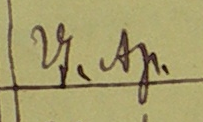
27. April
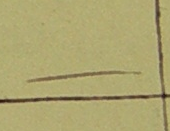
-
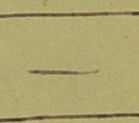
-
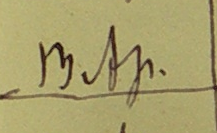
13. April
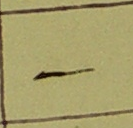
-
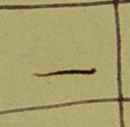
-
